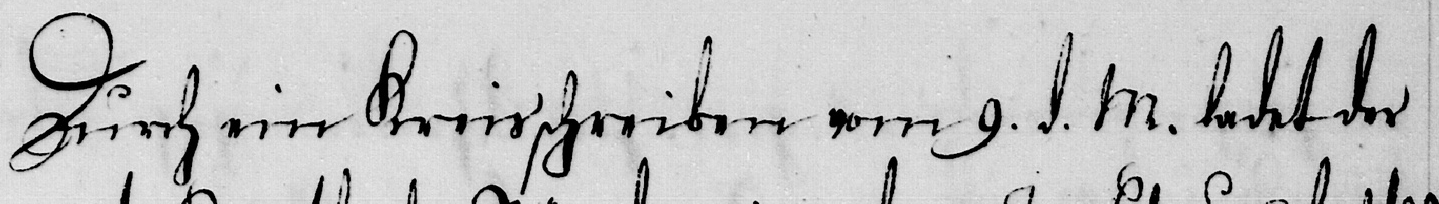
Durch ein Kreisschreiben vom 9. d. M. ladet der
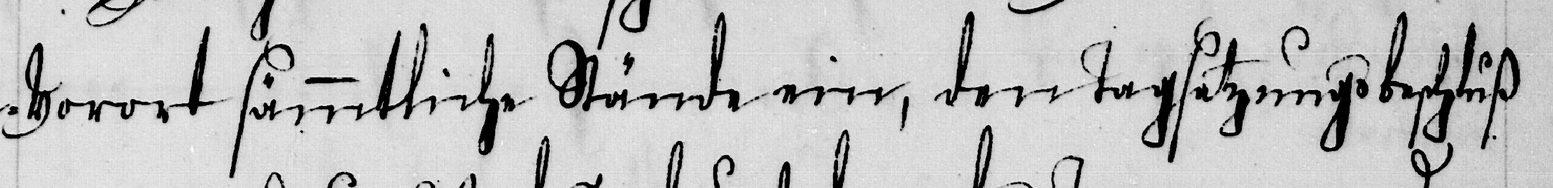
Vorort sämmtliche Stände ein, den Tagsatzungsbeschluß
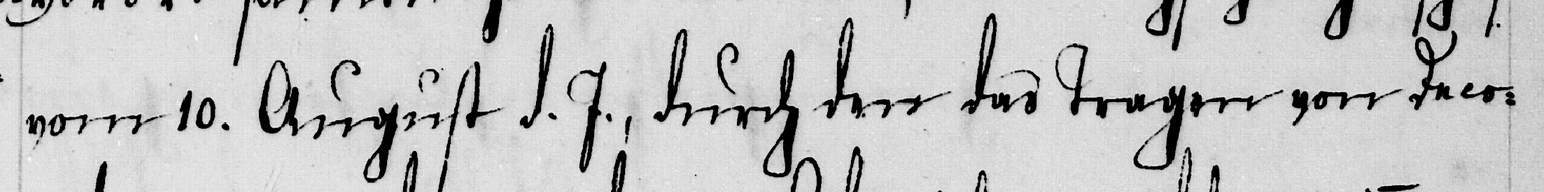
vom 10. August d. J., durch den das Tragen von Deco¬
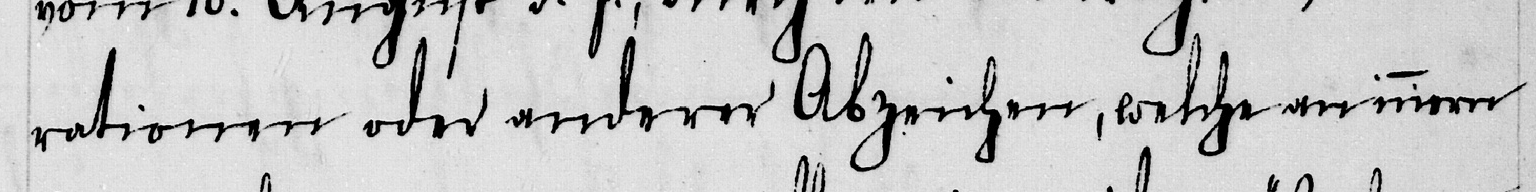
rationen oder anderer Abzeichen, welche an innern
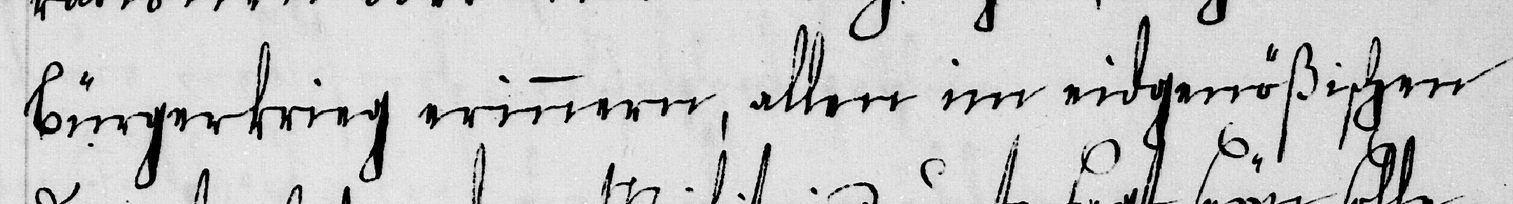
Bürgerkrieg erinnern, allen im eidgenößischen
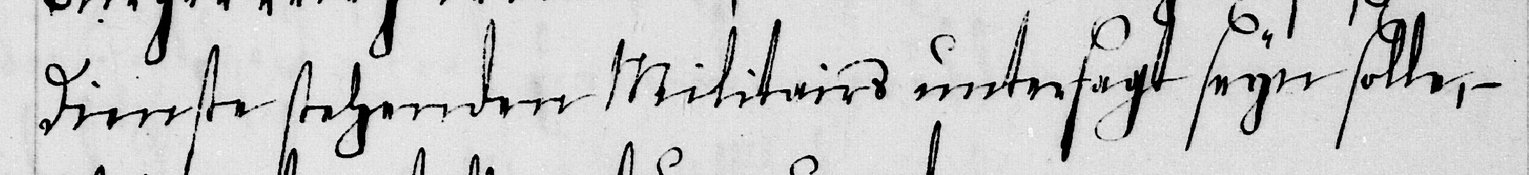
Dienste stehenden Militairs untersagt seyn solle, –
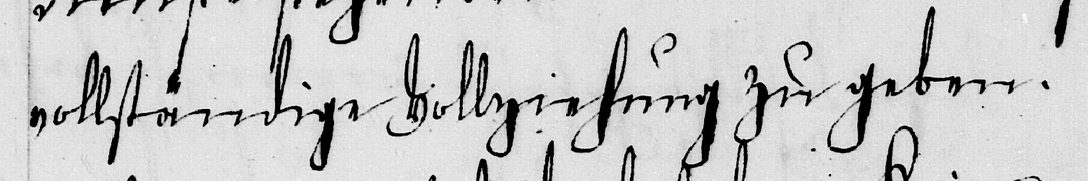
vollständige Vollziehung zu geben.
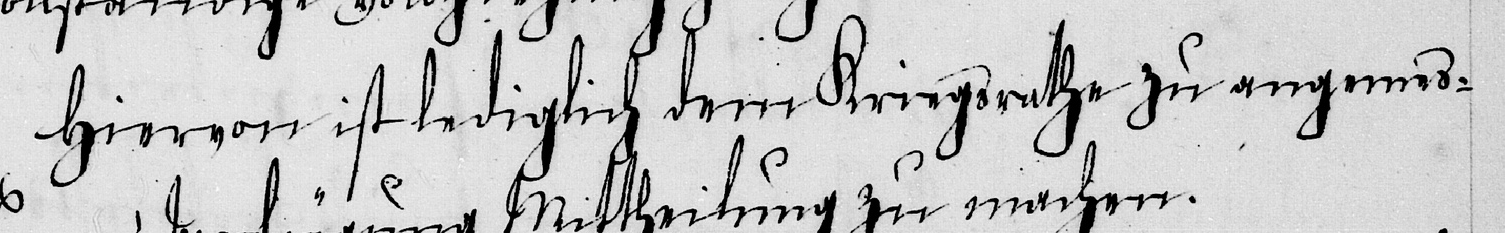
Hiervon ist lediglich dem Kriegsrathe zu angemeß¬
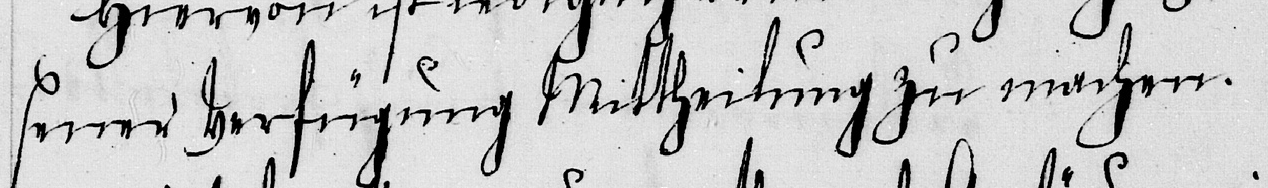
ener Verfügung Mittheilung zu machen.
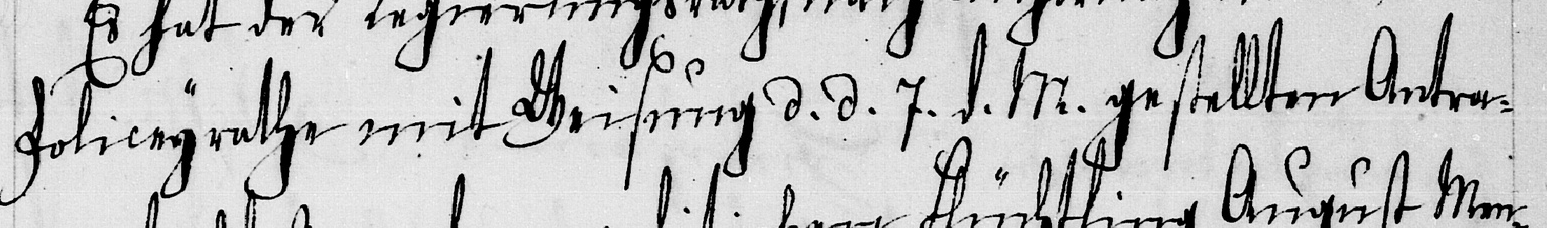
Policeyrathe mit Weisung d. d. 7. d. M. gestellten Antra¬
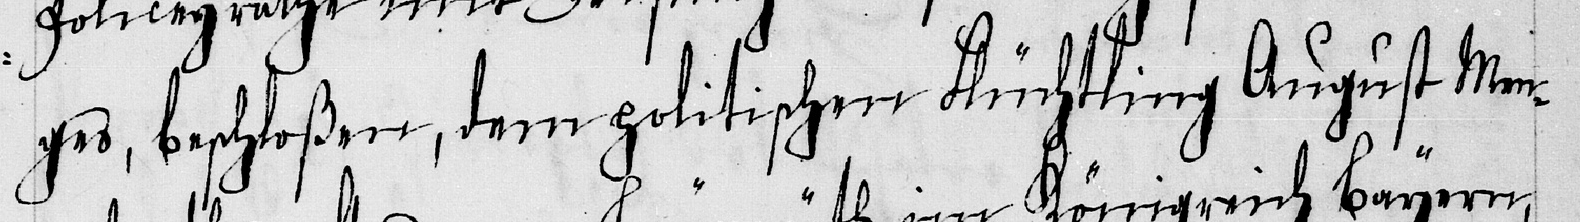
ges, beschloßen, dem politischen Flüchtling August Men¬
